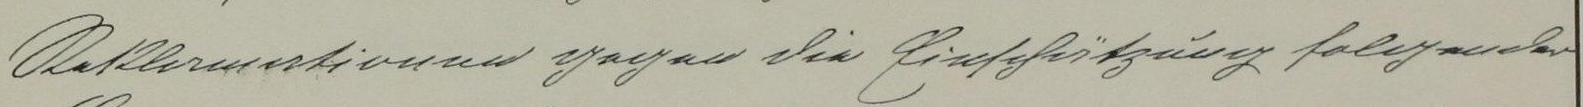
Reklamationen gegen die Einschätzung folgender
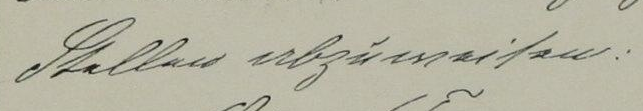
Stellen abzuweisen:
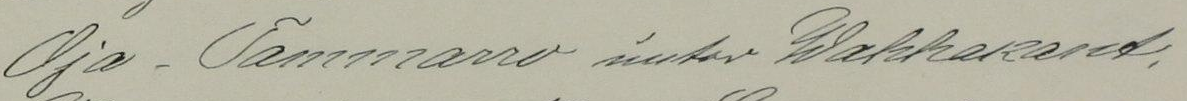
Oja-Tammarro unter Wahhakant,
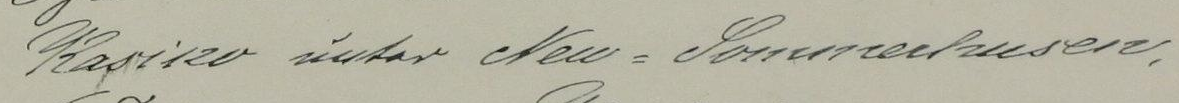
Kasiko unter Neu-Sommerhusen,
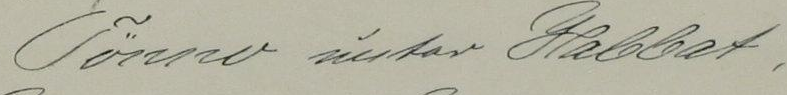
Tönno unter Habbat,
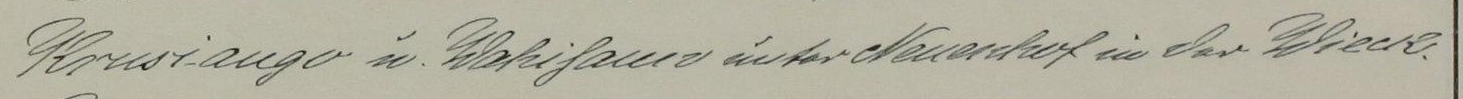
Krusiaugo u. Wahisaun unter Neuenhof in der Wieck.
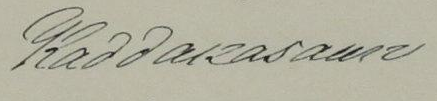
Kaddakasaun
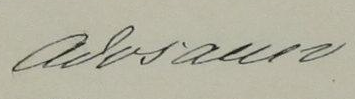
Adosaun
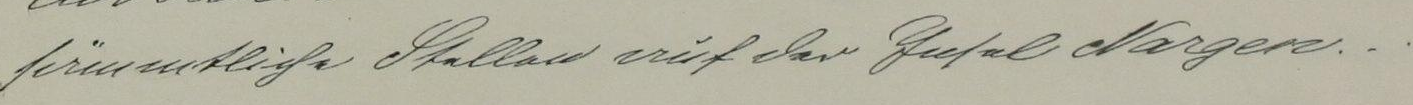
sämtliche Stellen auf der Insel Nargen.
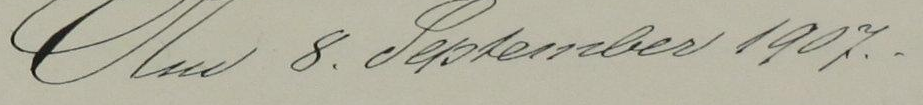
Am 8. September 1907.
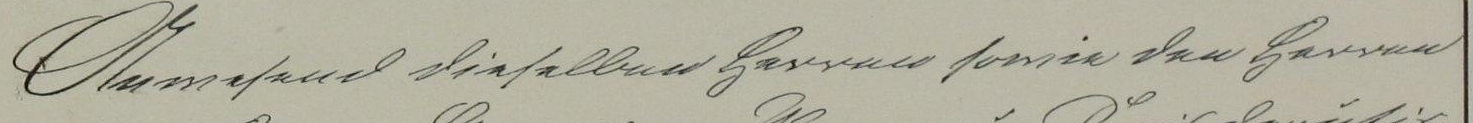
Anwesend dieselben Herren sowie die Herren
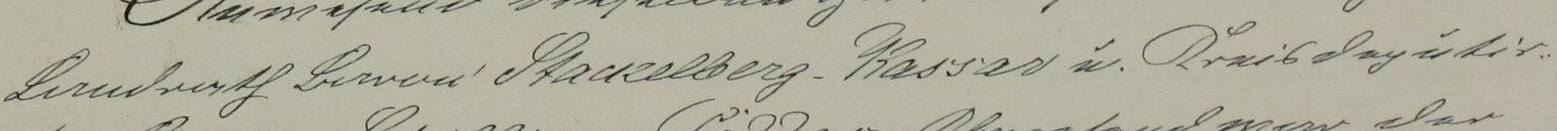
Landrath Baron Stackelberg-Kassar u. Kreisdeputir-
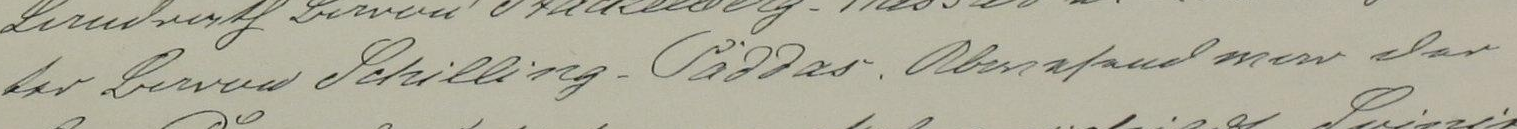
ter Baron Schilling-Paddas. Abwesend war der
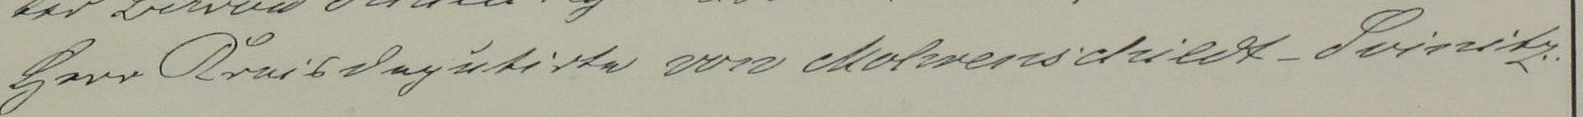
Herr Kreisdeputirte von Mohrenschildt-Soinitz.
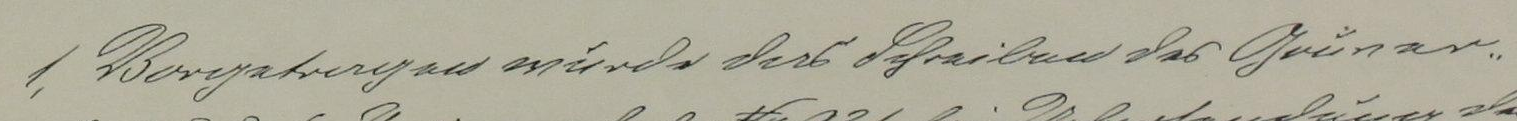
1. Vorgetragen wurde das Schreiben des Gouver-
